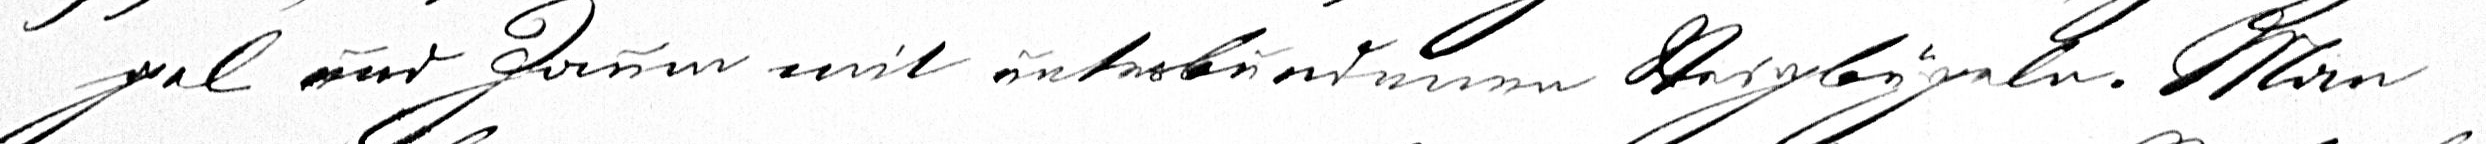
gel und Zaum mit unterbundenen Steigbügeln. Man
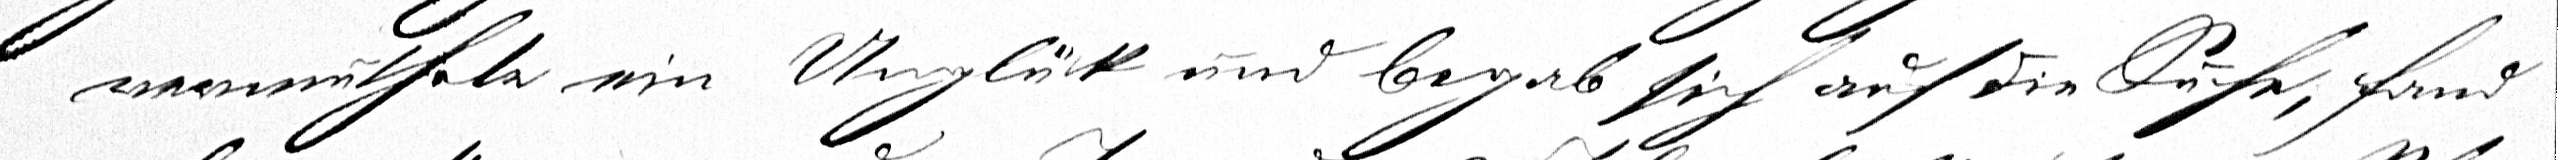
vermuthete ein Unglück und begab sich auf die Suche, fand
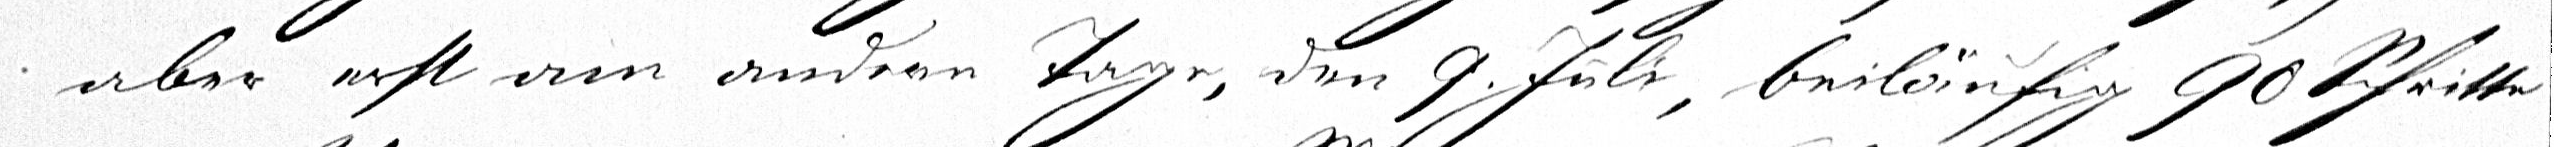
aber erst am andern Tage, den 9. Juli, beiläufig 90 Schritte
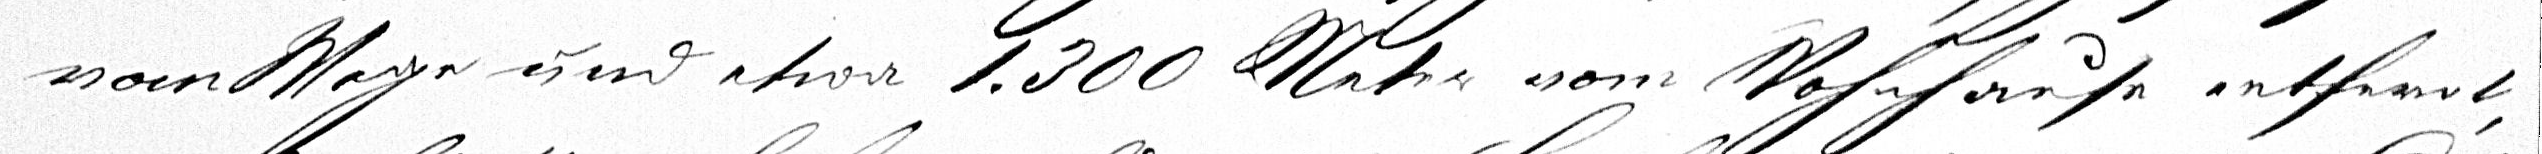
vom Wege und etwa 1.300 Meter vom Wohnhause entfernt
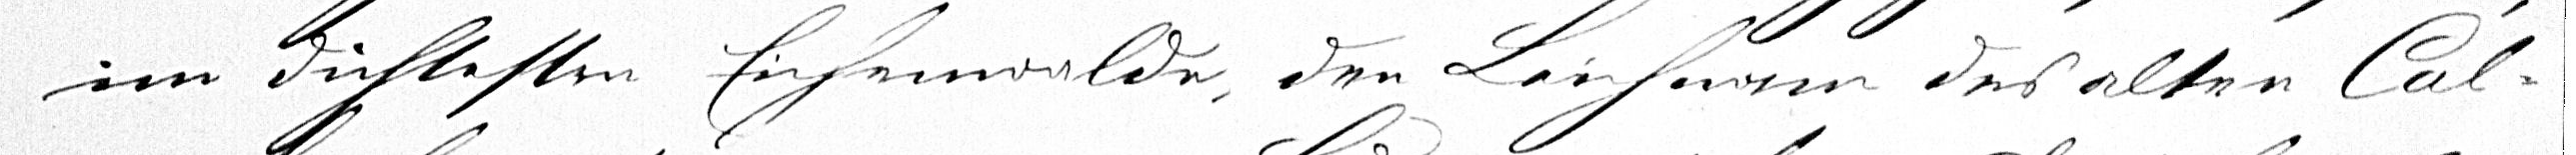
im dichtesten Eichenwalde, den Leichnam des alter Cal¬
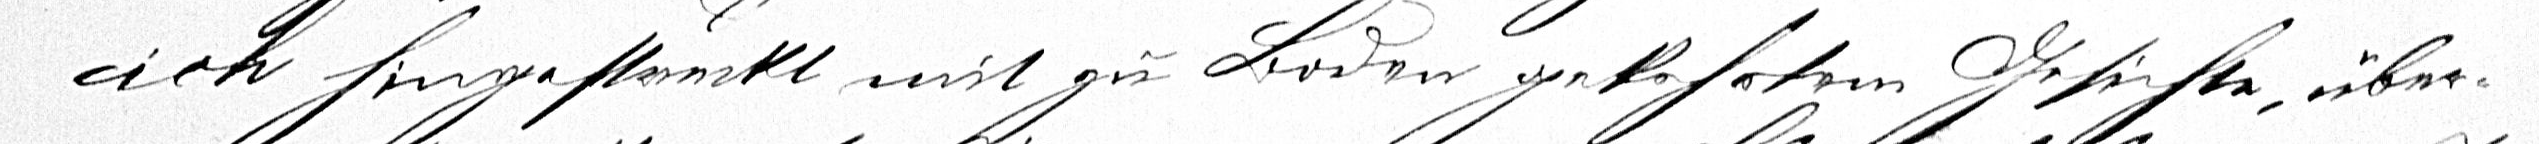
cich hingestreckt mit zu Boden gekehrten Gesichte, über¬
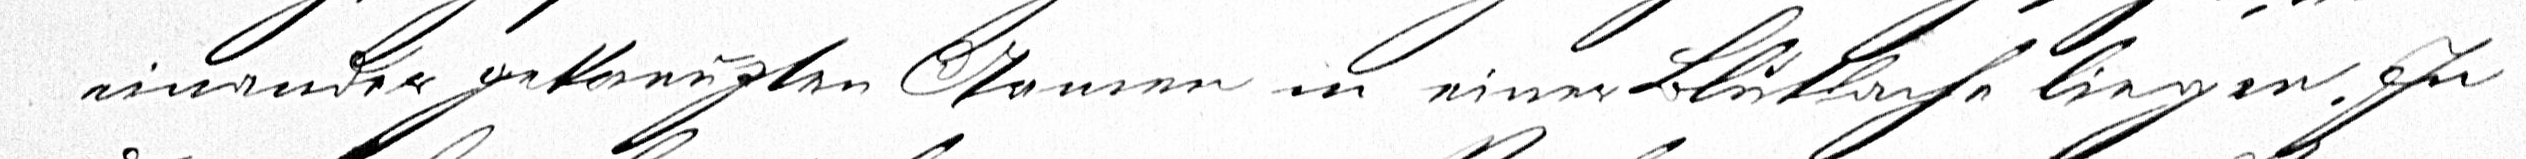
einander gekreuzten Armen in einer Blutlache liegen. In
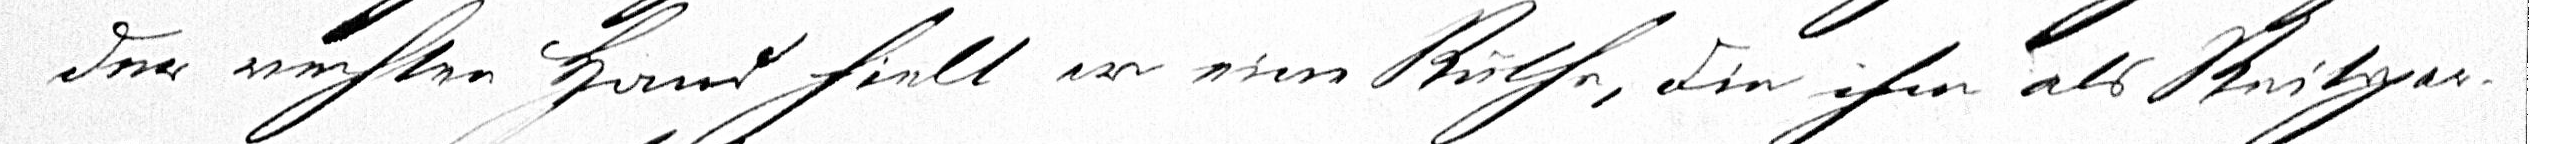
der rechten Hand hielt er eine Ruthe, die ihm als Reitger¬
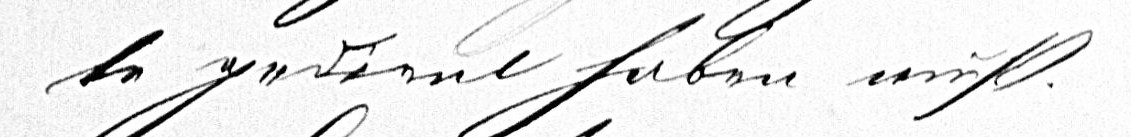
te gedient haben muß.
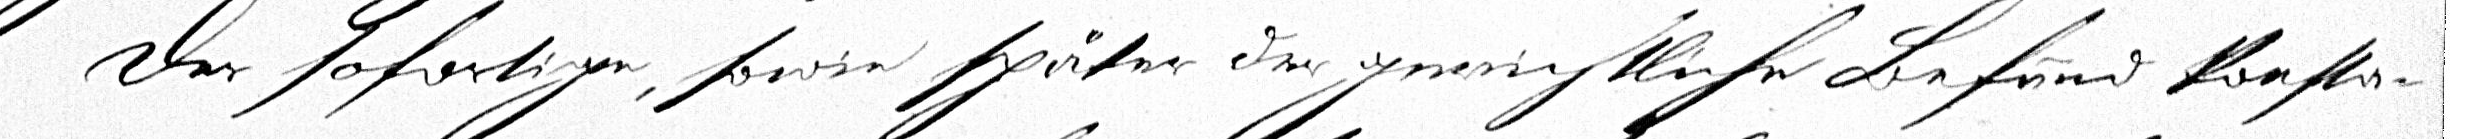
Der sofortige, sowie später der gerichtliche Befund konsta¬
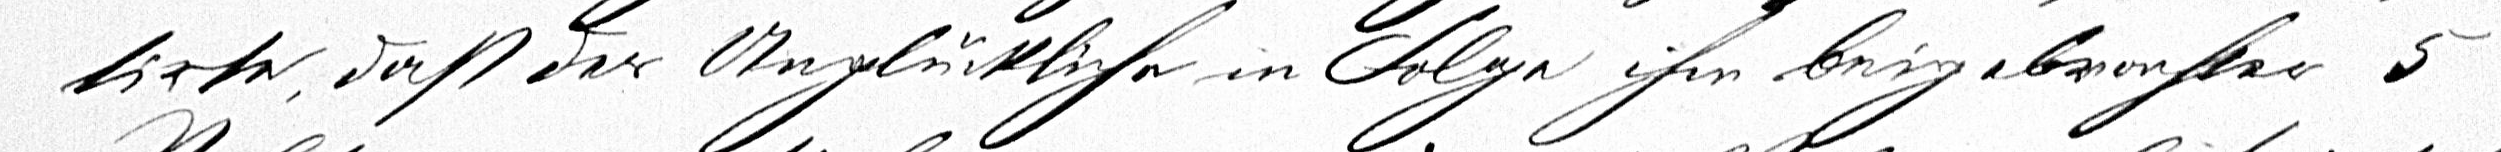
tirte, daß der Unglückliche in Folge ihm beigebrachter 5
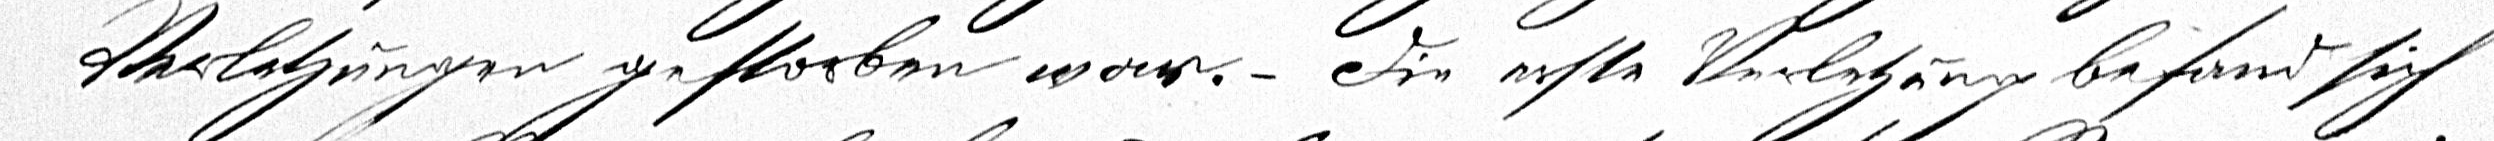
Verletzungen gestorben war.- Die erste Verletzung befand sich
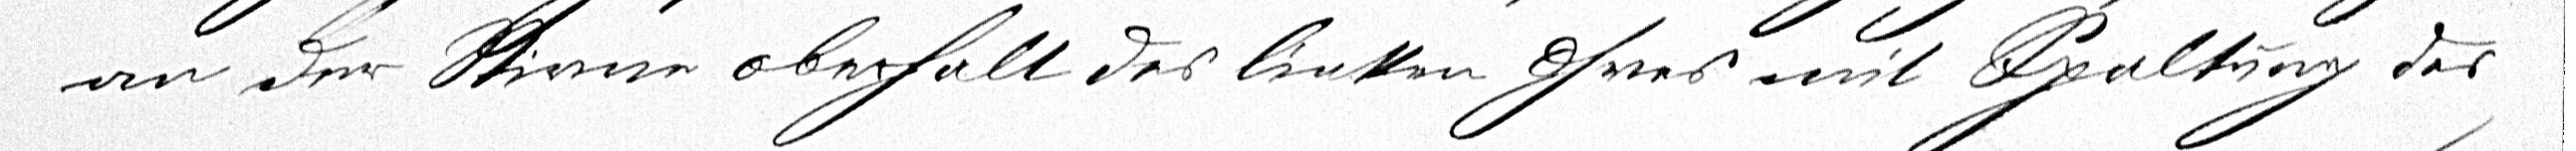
an der Stirne oberhalt des linken Ohres mit Spaltung des
